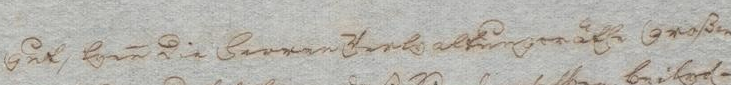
gut, wenn die Herren Verwaltungsräthe großen
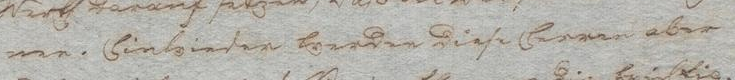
nen. Hinwieder werden diese Herren aber
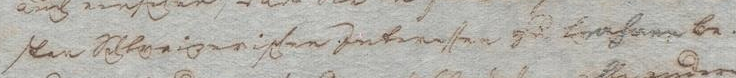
sten Schweizerischen Interessen zu wahren be-
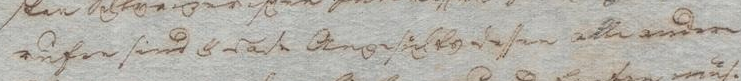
rufen sind & daß Angesichts dessen alle andern
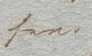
sen.
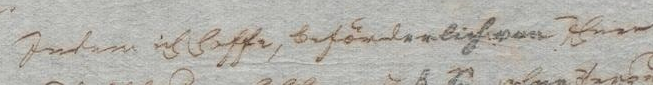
Indem ich hoffe, beförderlich von Ihnen
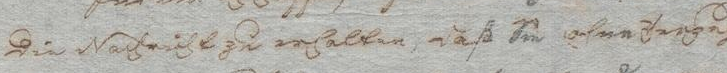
die Nachricht zu erhalten, daß Sie ohne Verzug
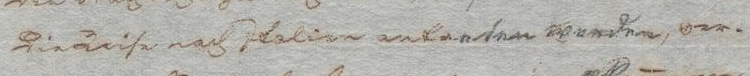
die Reise nach Italien antreten werden, ver-
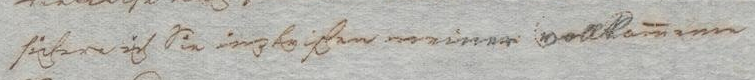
sichere ich Sie inzwischen meiner vollkommenen
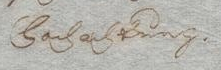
Hochachtung.
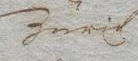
Zürich
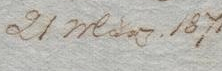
21 März 1871.
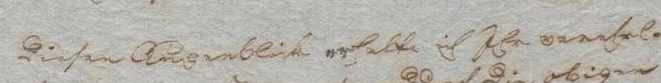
Diesen Augenblick erhalte ich Ihr verehrl.
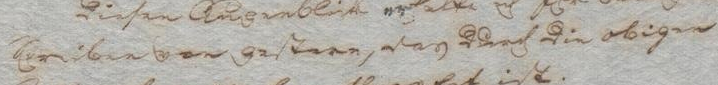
Schreiben von gestern, das durch die obigen
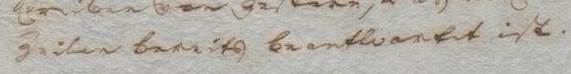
Zeilen bereits beantwortet ist.
